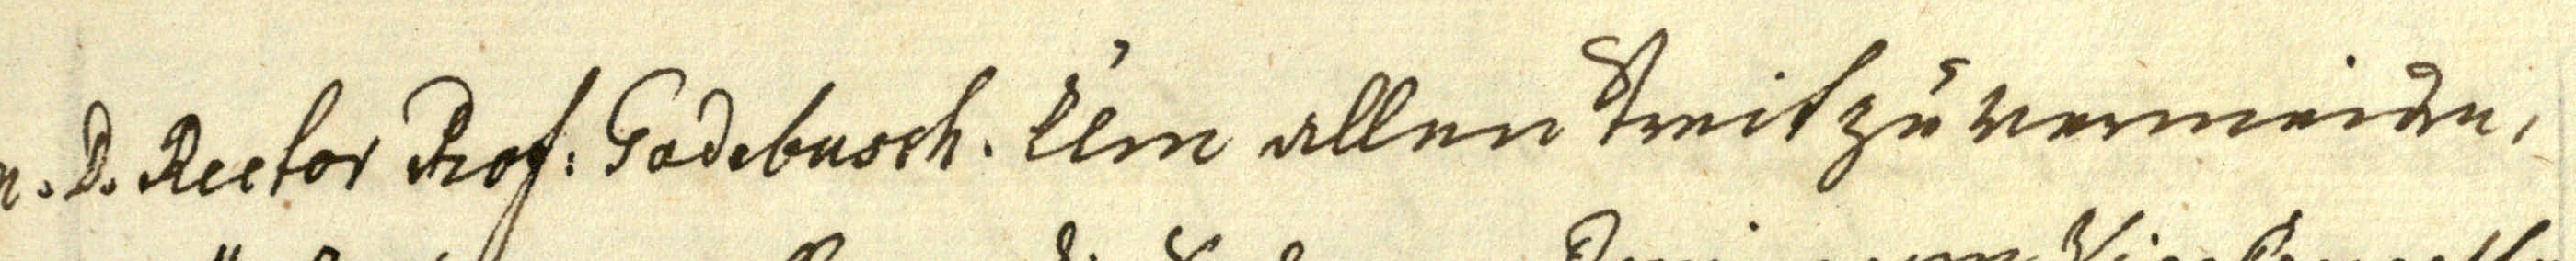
M.D. Rector Prof. Gadebusch. Um allen Streit zu vermeiden,
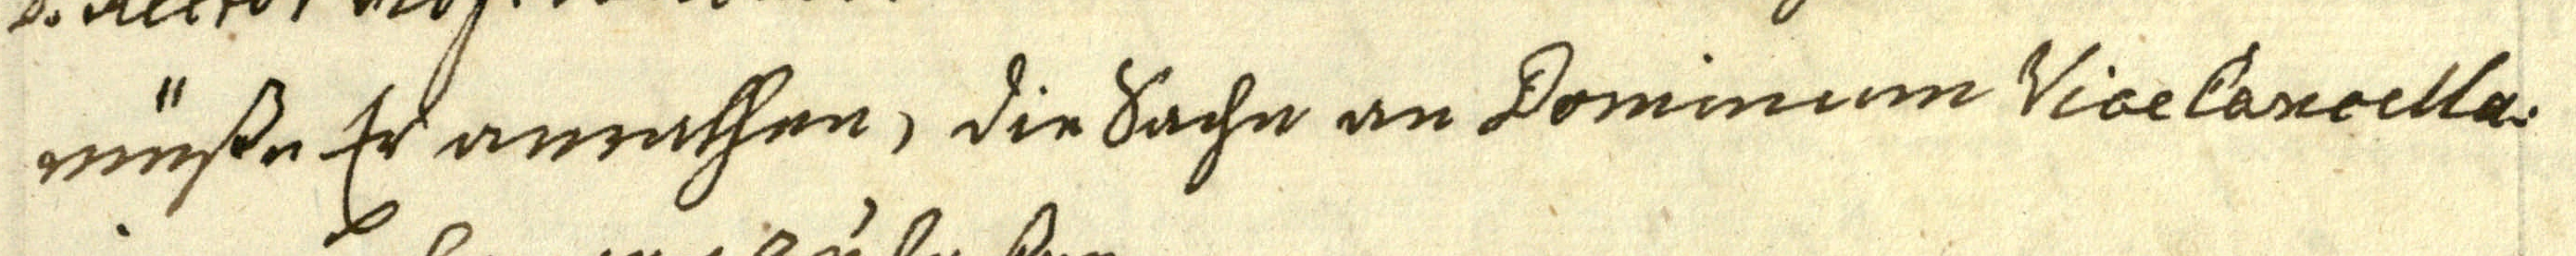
müße Er anrathen, die Sache an Dominum ViaeCancella¬
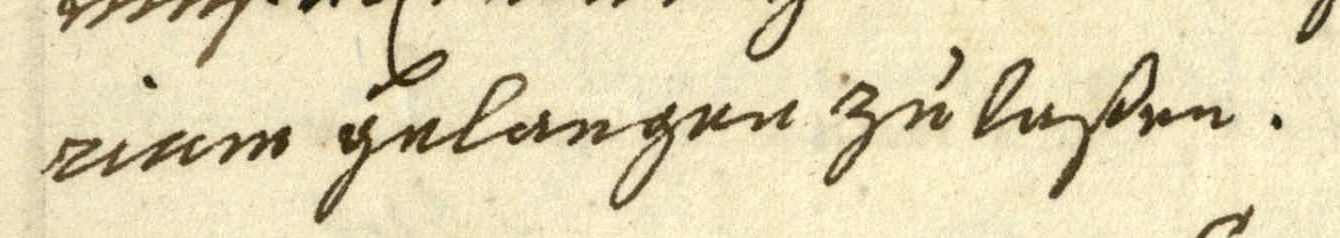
rium gelangen zu laßen.
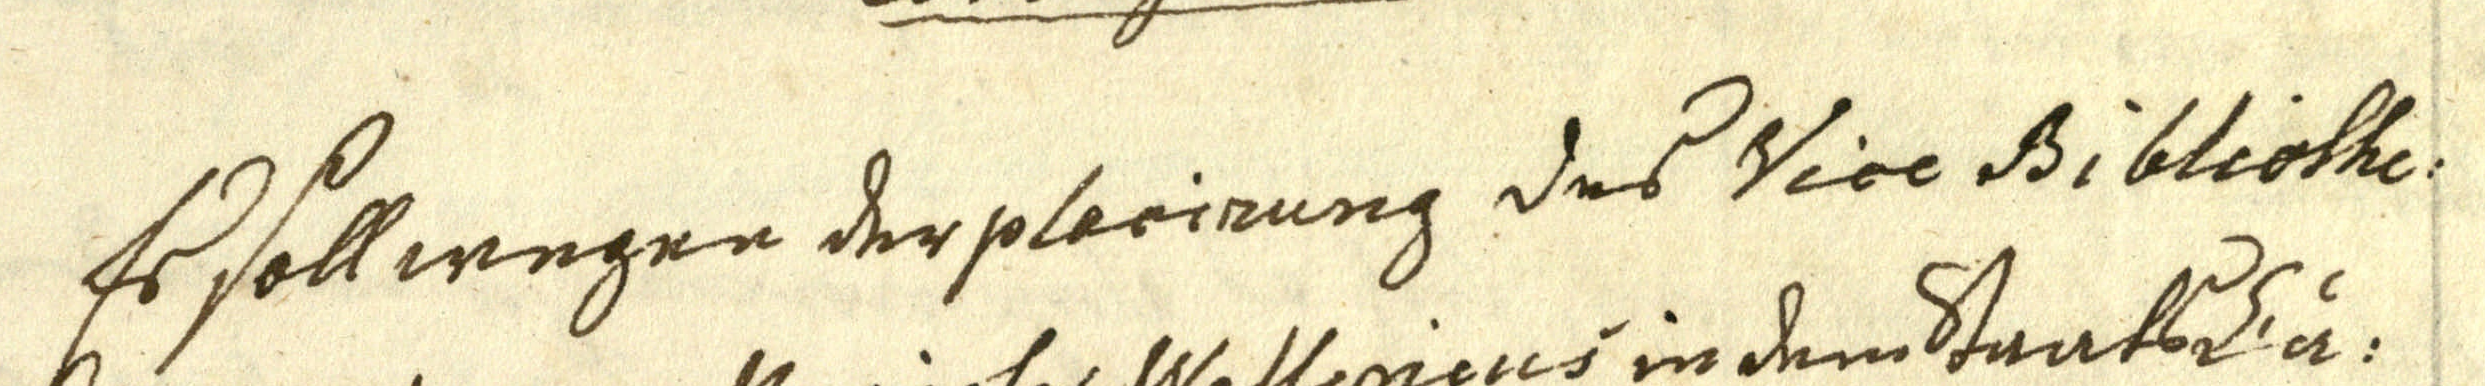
Er soll wegen der placirung das Vice Bibliothe¬
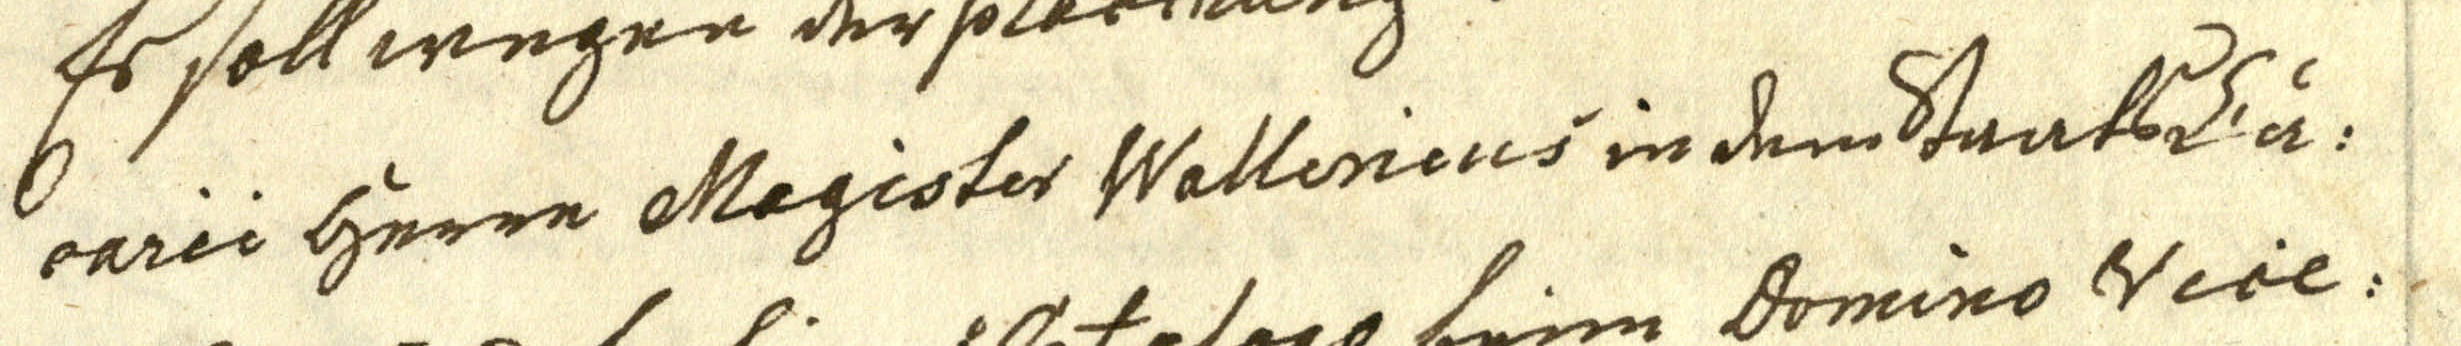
carii Herrn Magister Wallenius in dem Staatska¬
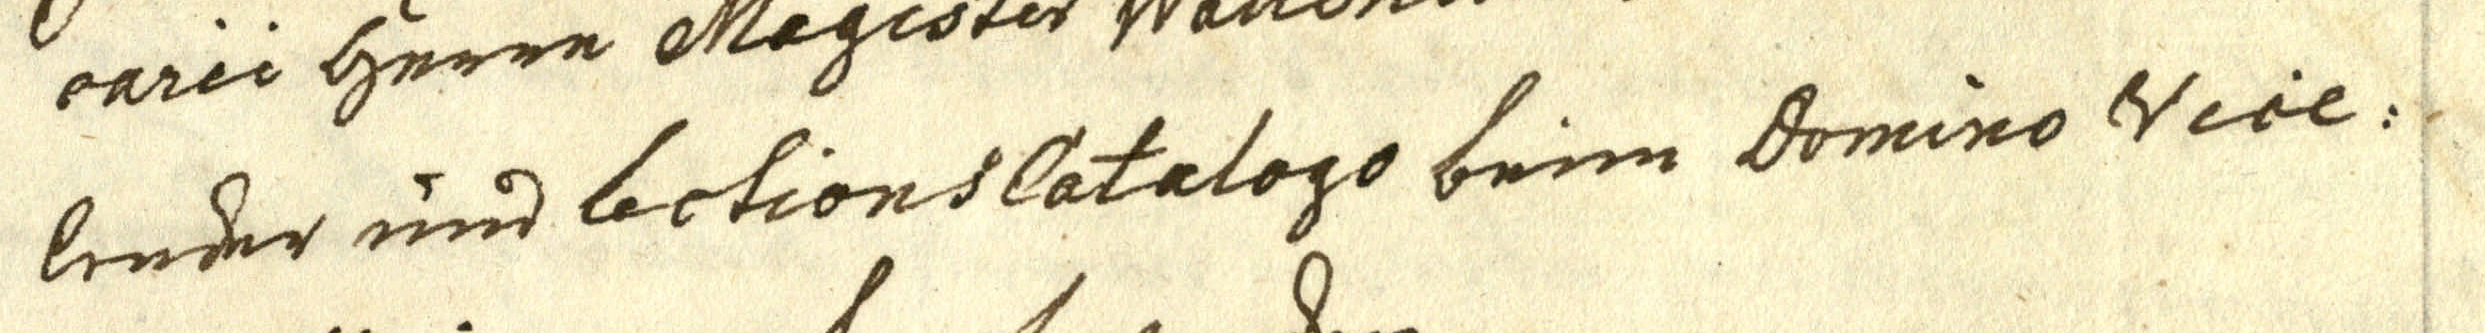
lender und LectionsCatalogo beim Domino Vice¬
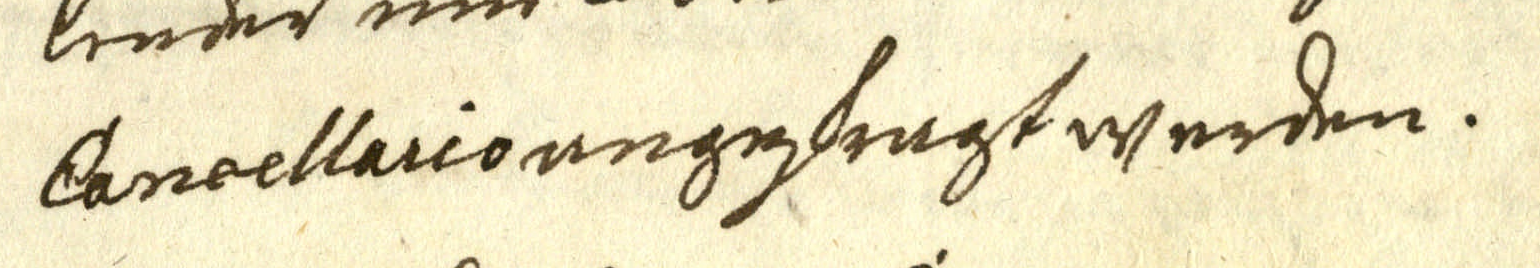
Cancellario angefragt werden.
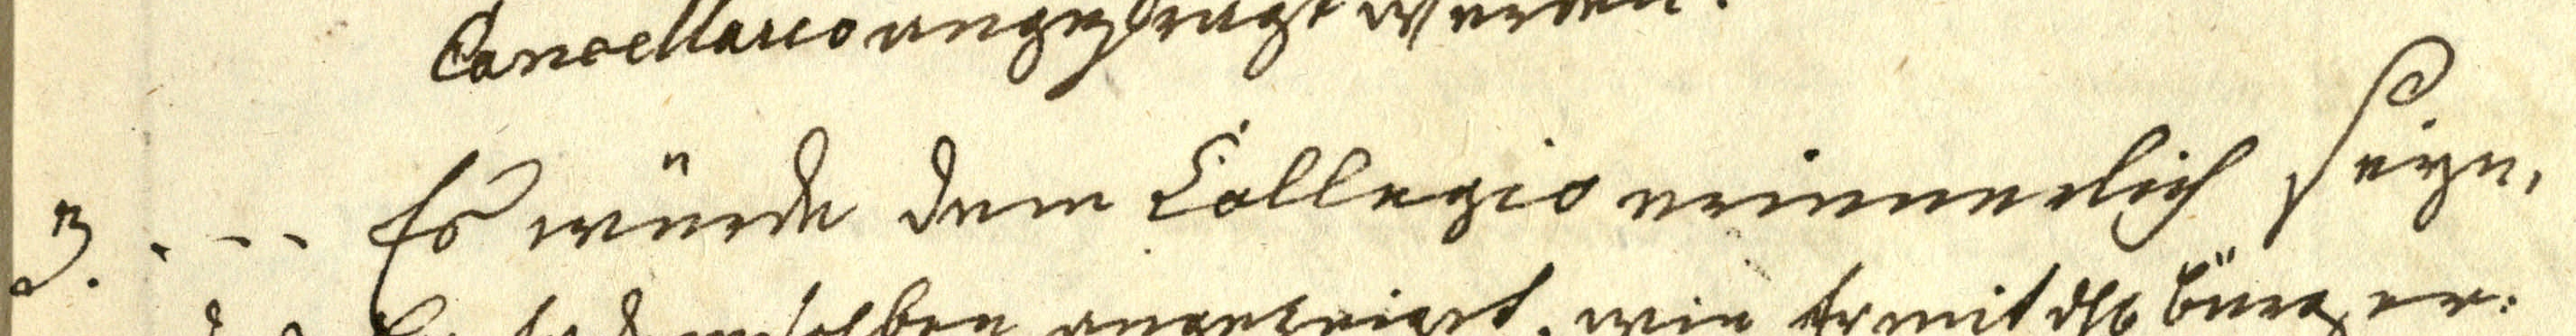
3. Es würde dem Collegio erinnerlich seÿn,
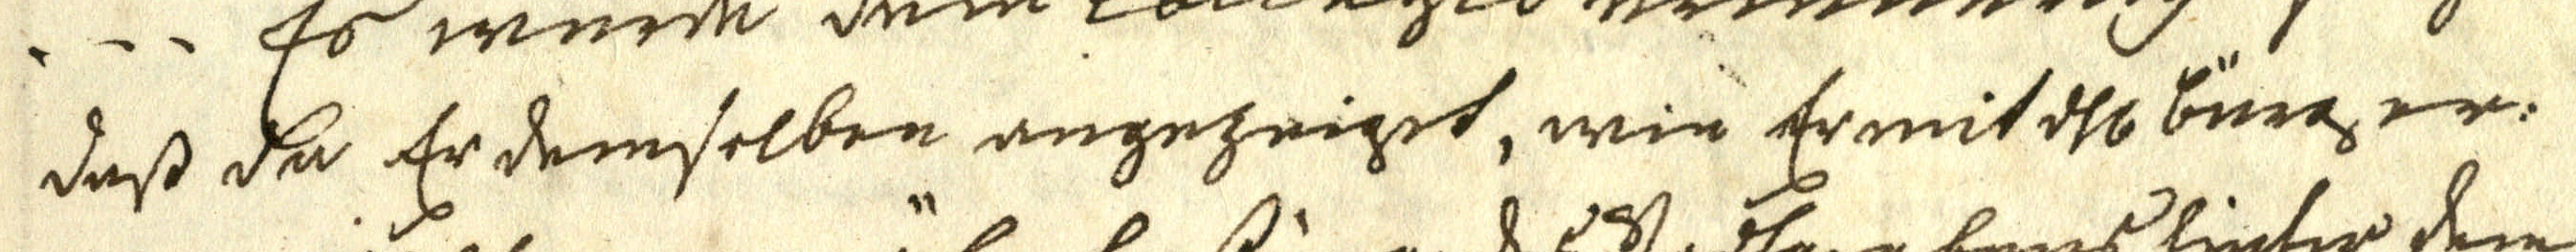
daß da Er demselben angezeiget, wie Er mit dh. Bürger¬
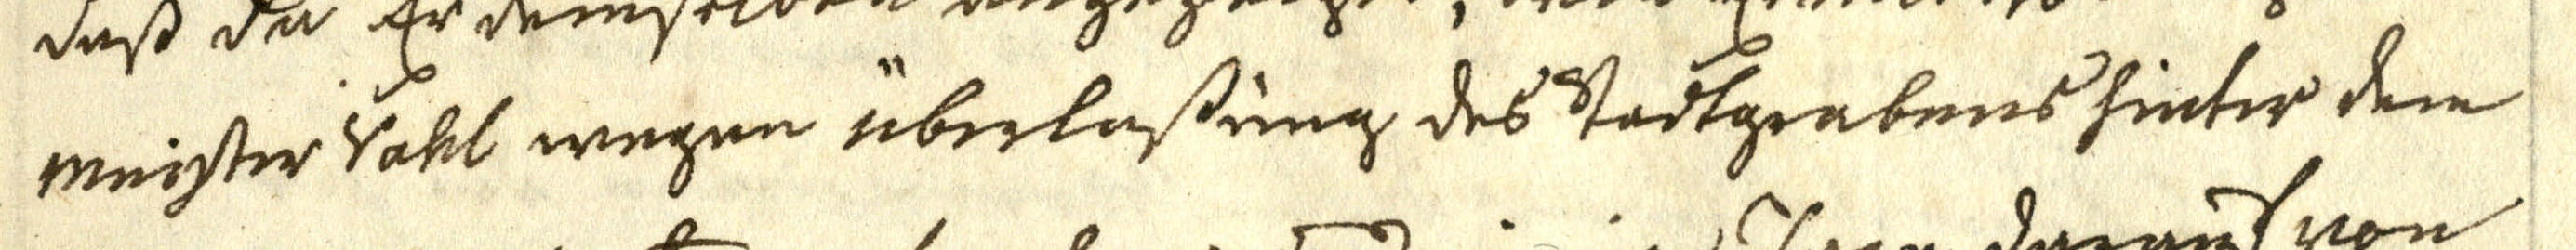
Meister Vahl wegen Überlaßung des Stadtgrabens hinter dem
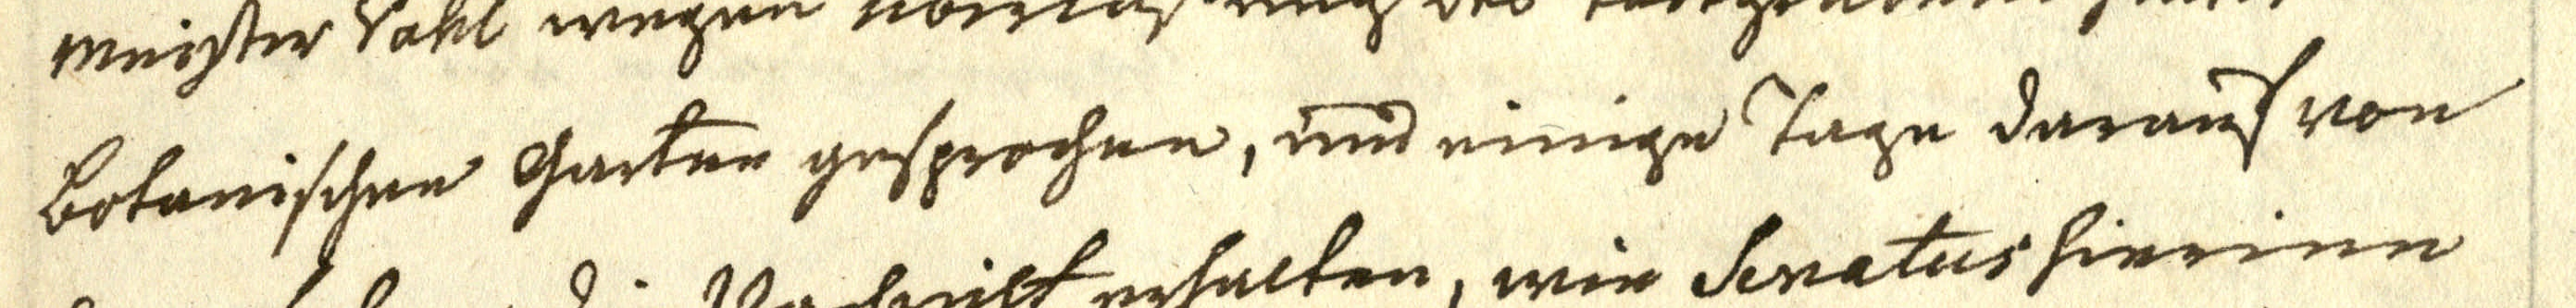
Botanischen Garten gesprochen, und einige Tage darauf von
